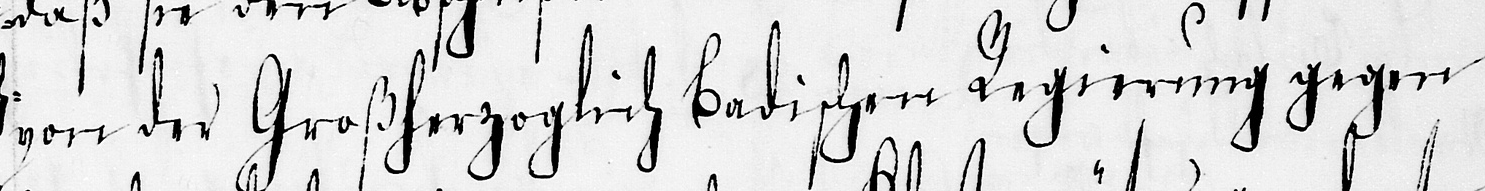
von der Großherzoglich Badischen Regierung gegen
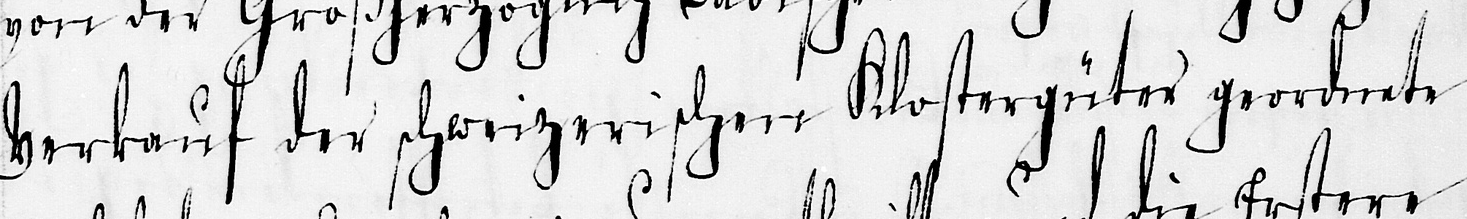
Verkauf der schweizerischen Klostergüter geordnete
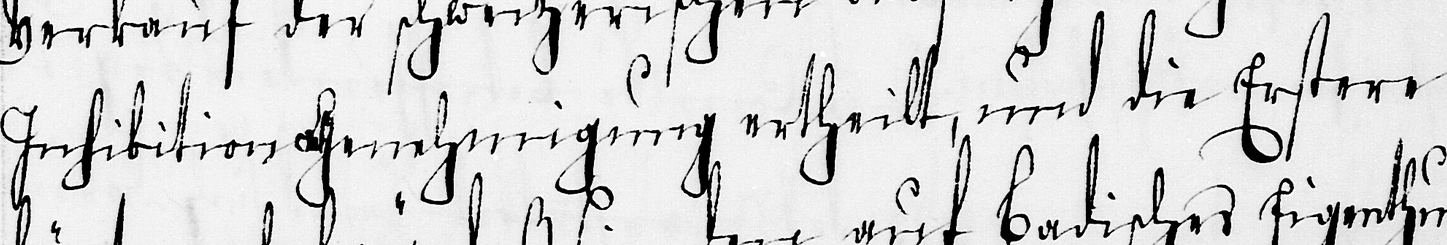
Inhibition Genehmigung ertheilt, und die Erstere
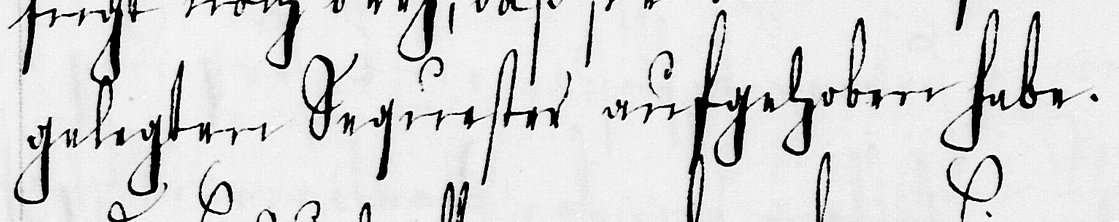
gelegten Sequester aufgehoben habe.
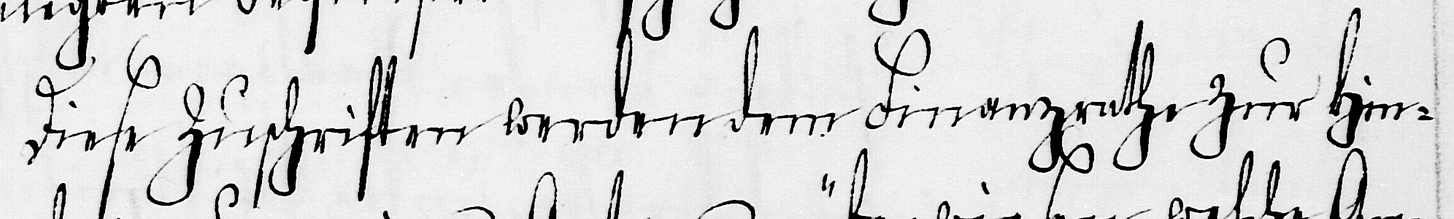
Diese Zuschriften werden dem Finanzrathe zur Hin¬
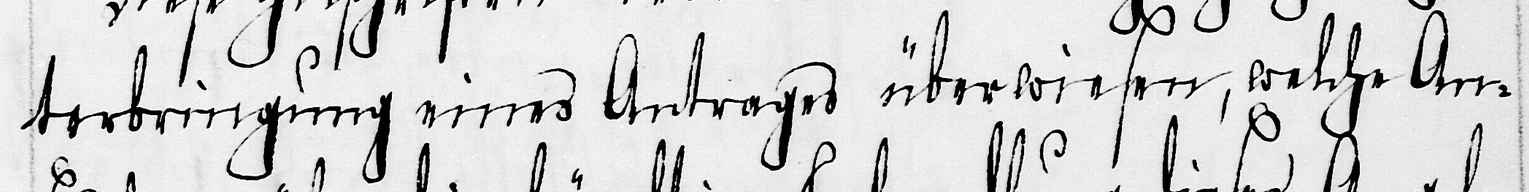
terbringung eines Antrages überwiesen, welche An¬
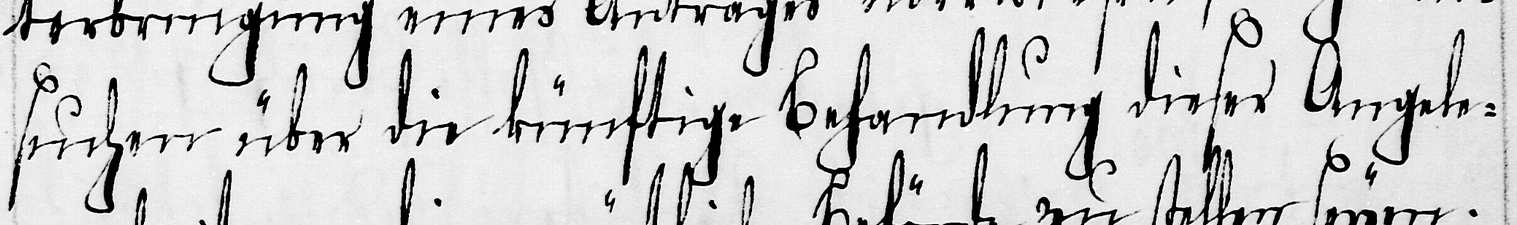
suchen über die künftige Behandlung dieser Angele¬
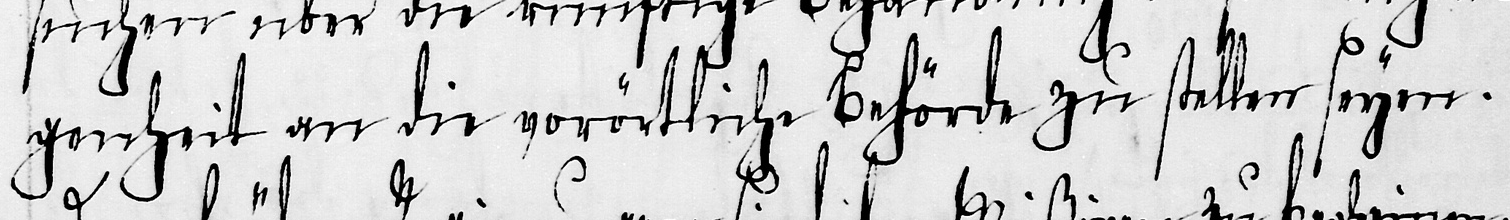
genheit an die vorörtliche Behörde zu stellen seyen.
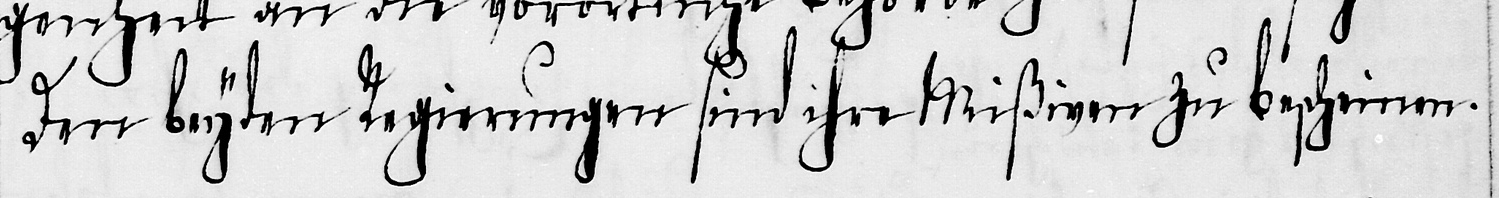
Den beyden Regierungen sind ihre Mißiven zu bescheinen.
